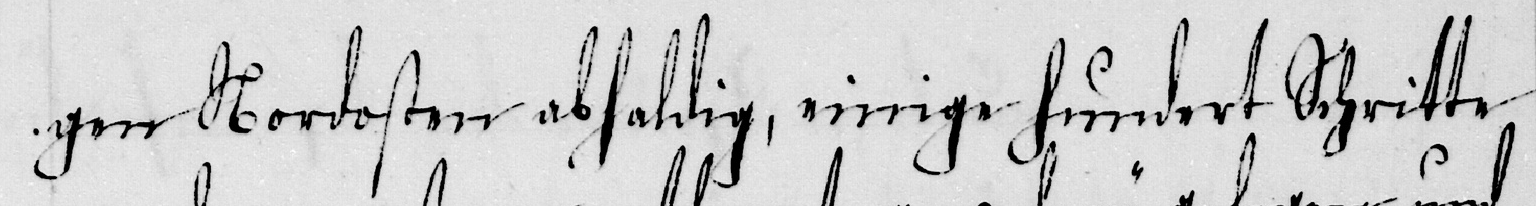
gen Nordosten abhaldig, einige hundert Schritte
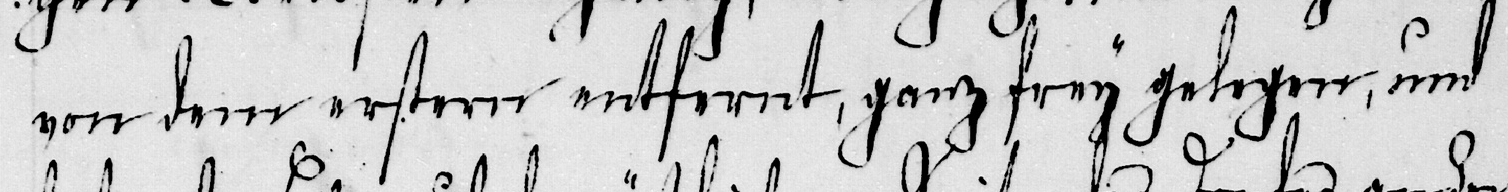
von dem erstern entfernt, ganz frey gelegen, und
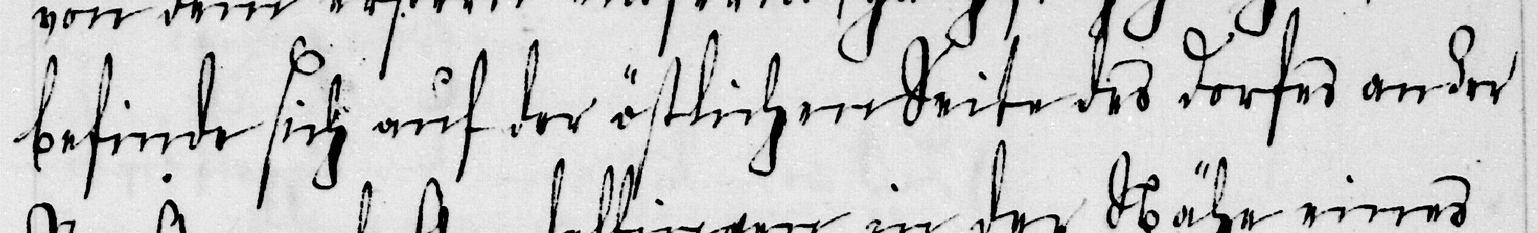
befinde sich auf der östlichen Seite des Dorfes an der
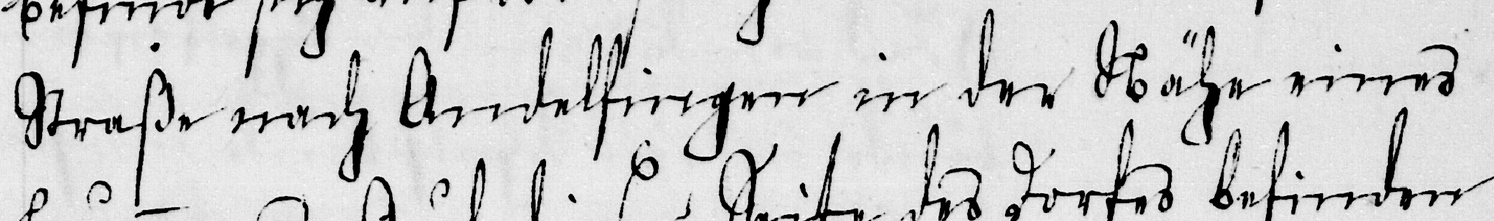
Straße nach Andelfingen in der Nähe eines
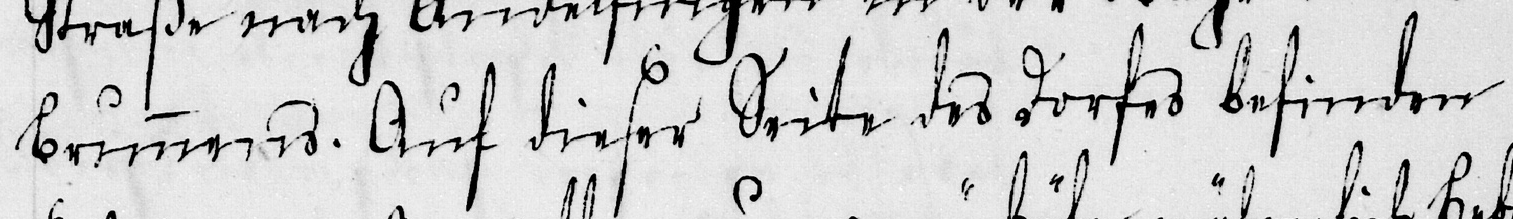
Brunnens. Auf dieser Seite des Dorfes befinden
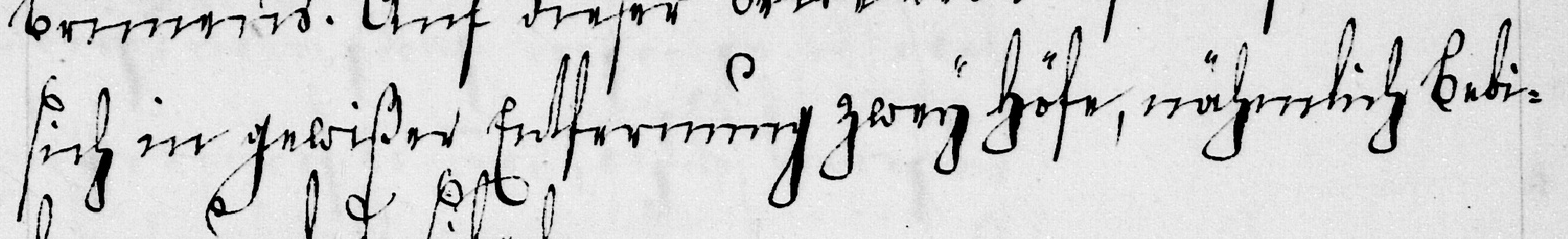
sich in gewißer Entfernung zwey Höfe, nähmlich Bebi¬
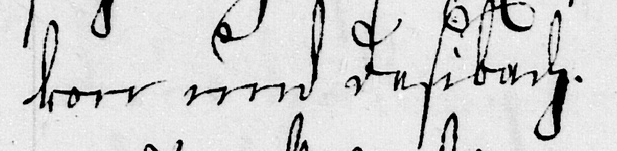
kon und Desibach.
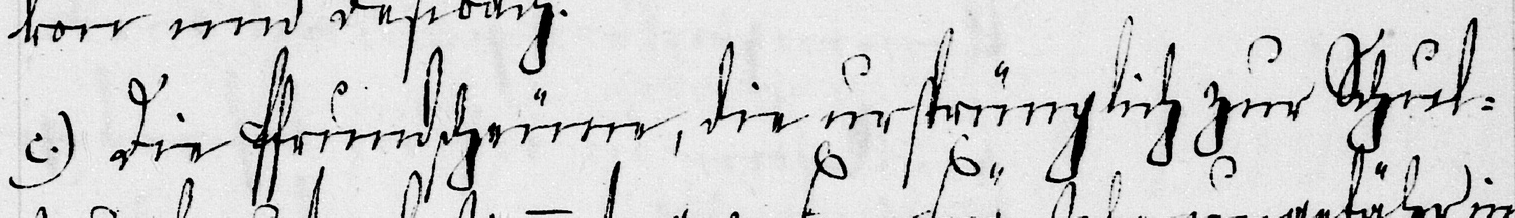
c.) Die Pfrundscheune, die ursprünglich zur Schul¬
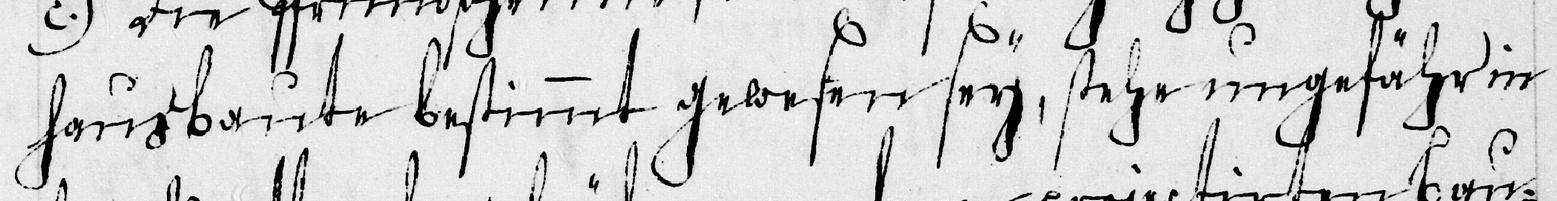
hausbaute bestimmt gewesen sey, stehe ungefähr in
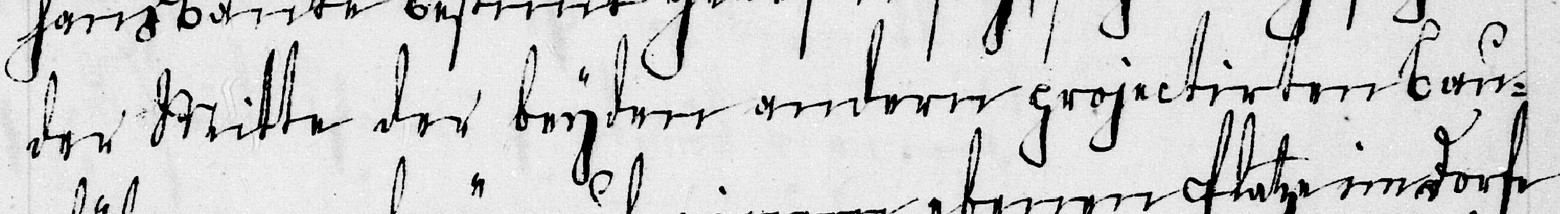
der Mitte der beyden andern projectirten Bau¬
